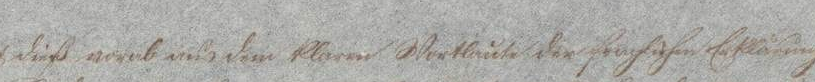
dieß vorab aus dem klaren Wortlaute der fraglichen Erklärung
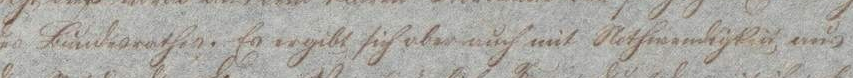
des Bundesrathes. Es ergibt sich aber auch mit Nothwendigkeit aus
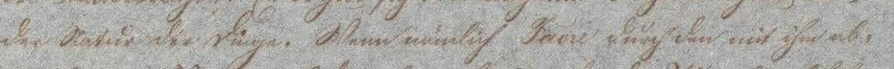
der Natur der Dinge. Wenn nämlich Favre durch den mit ihm ab-
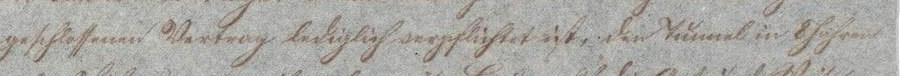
geschlossenen Vertrag lediglich verpflichtet ist, den Tunnel in 8 Jahren
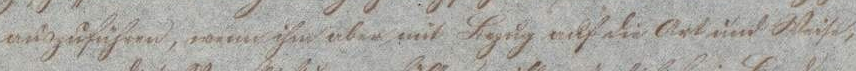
auszuführen, wenn ihm aber mit Bezug auf die Art und Weise,
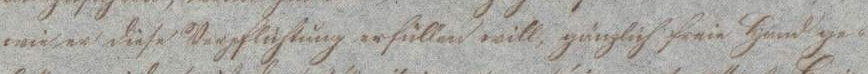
wie er diese Verpflichtung erfüllen will, gänzlich freie Hand ge-
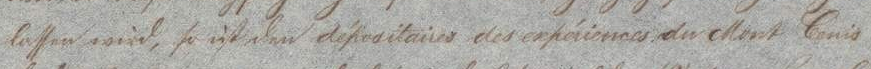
lassen wird, so ist den dépositaires des expériences du Mont Cenis
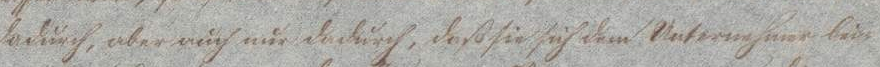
dadurch, aber auch nur dadurch, daß sie sich dem Unternehmer bei-
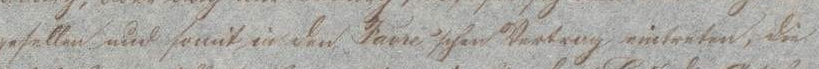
gesellen und somit in den Favre'schen Vertrag eintreten, die
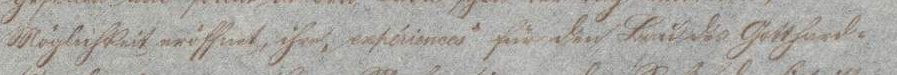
Möglichkeit eröffnet, ihre «expériences» für den Bau des Gotthard -
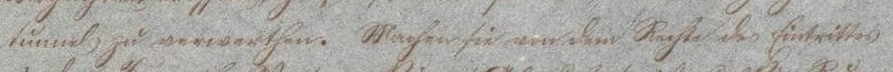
tunnels zu verwerthen. Machen Sie von dem Rechte des Eintrittes
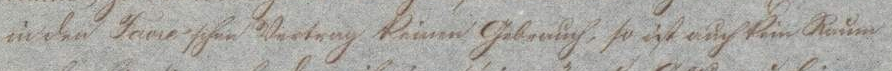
in den Favre'schen Vertrag keinen Gebrauch, so ist auch kein Raum
